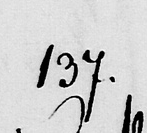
17.
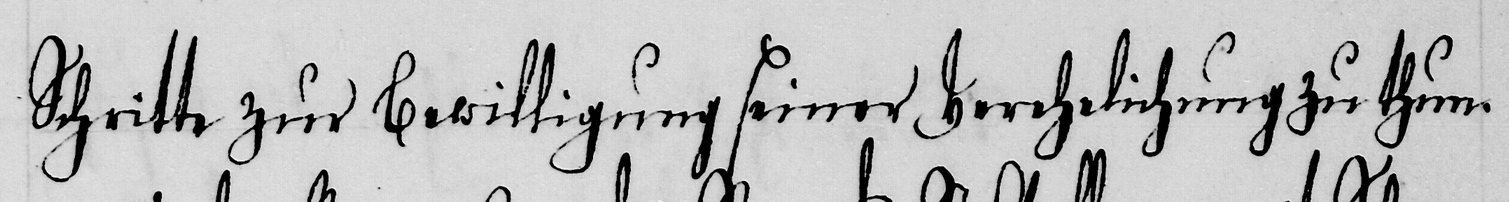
Schritte zur Bewilligung seiner Verehelichung zu thun.
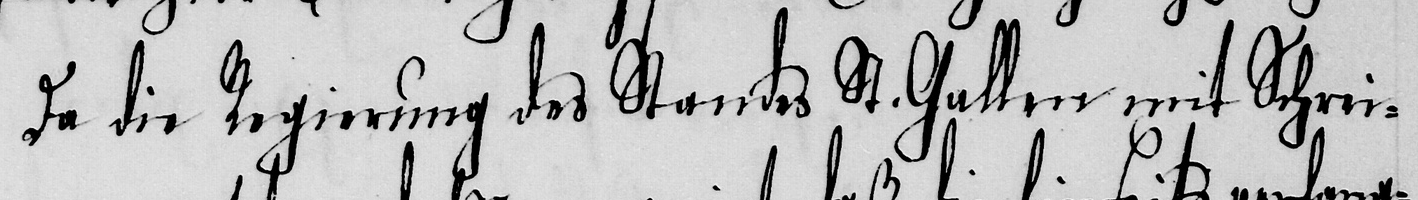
Da die Regierung des Standes St. Gallen mit Schrei¬
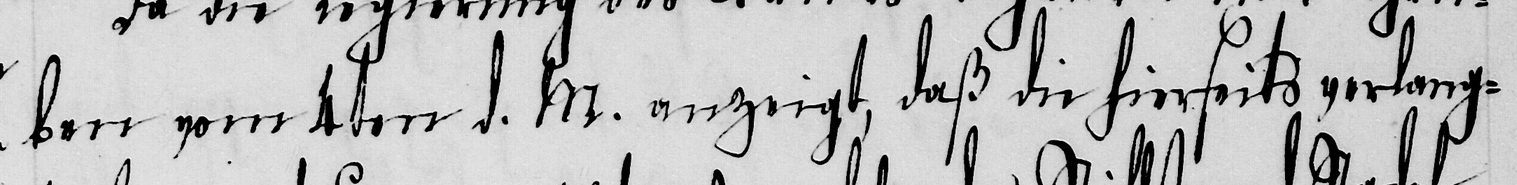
ben vom 4ten d. M. anzeigt, daß die hierseits verlang¬
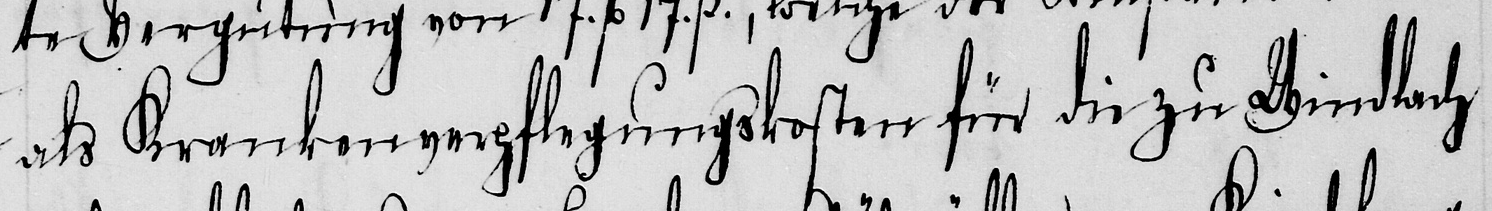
als Krankenverpflegungskosten für die zu Windlach
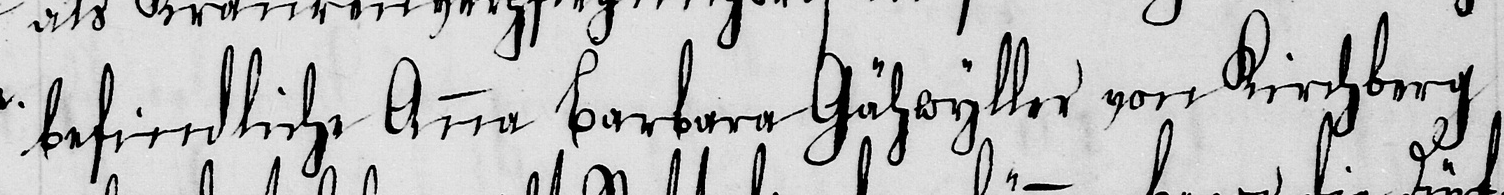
befindliche Anna Barbara Gähwyller von Kirchberg
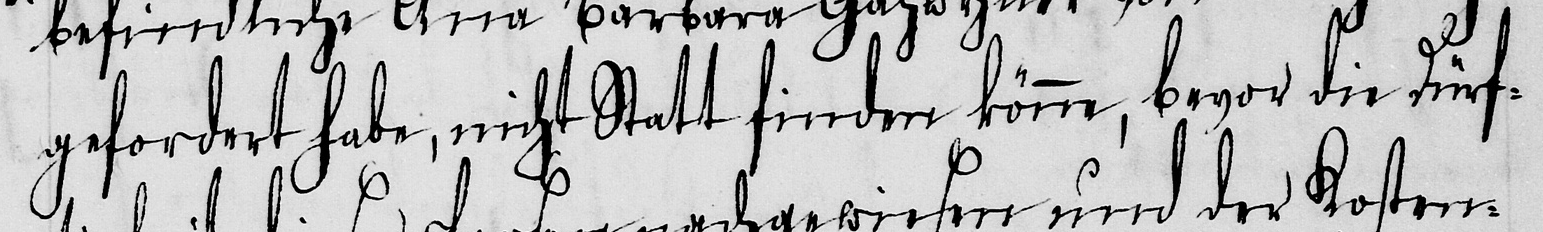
gefordert habe, nicht Statt finden könne, bevor die Dürf¬
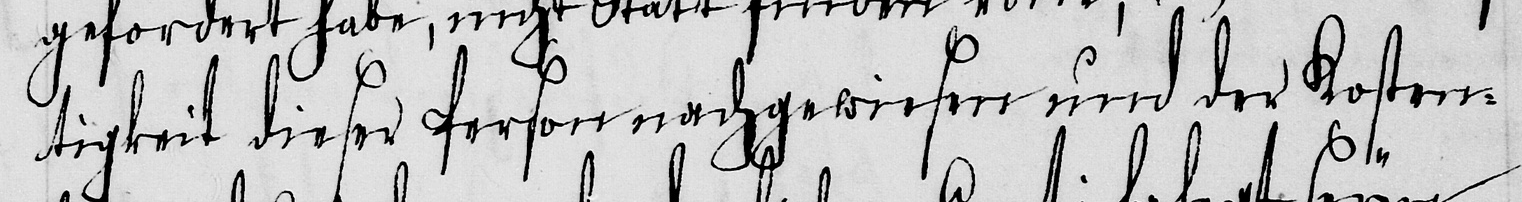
tigkeit dieser Person nachgewiesen und der Kosten¬
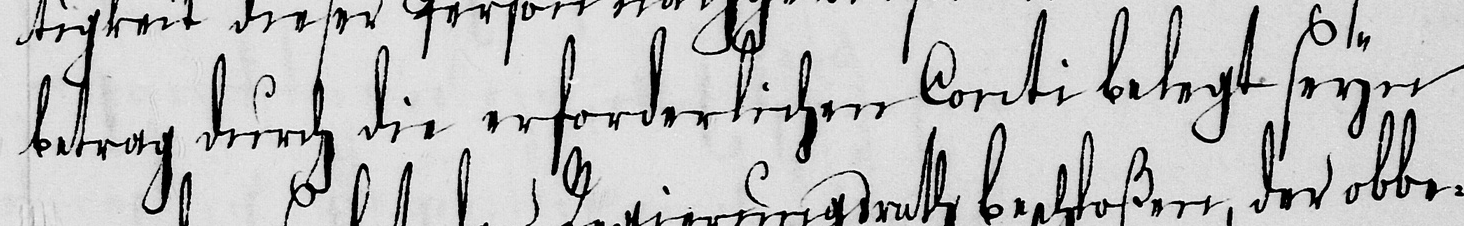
betrag durch die erforderlichen Conti belegt seyn
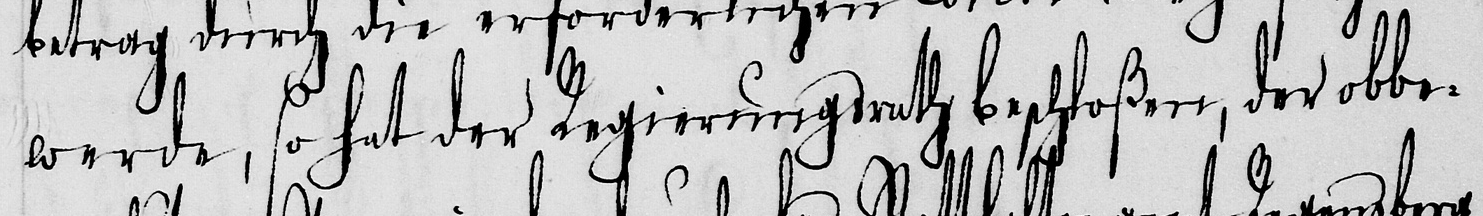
werde, so hat der Regierungsrath beschloßen, der obbe¬
